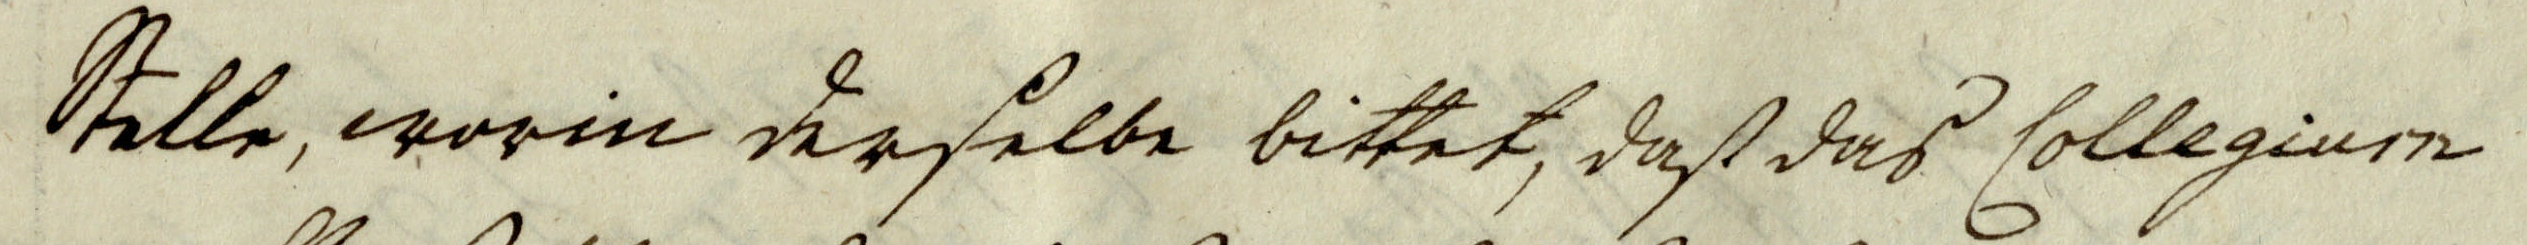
Stelle, worin derselbe bittet, daß das Collegium
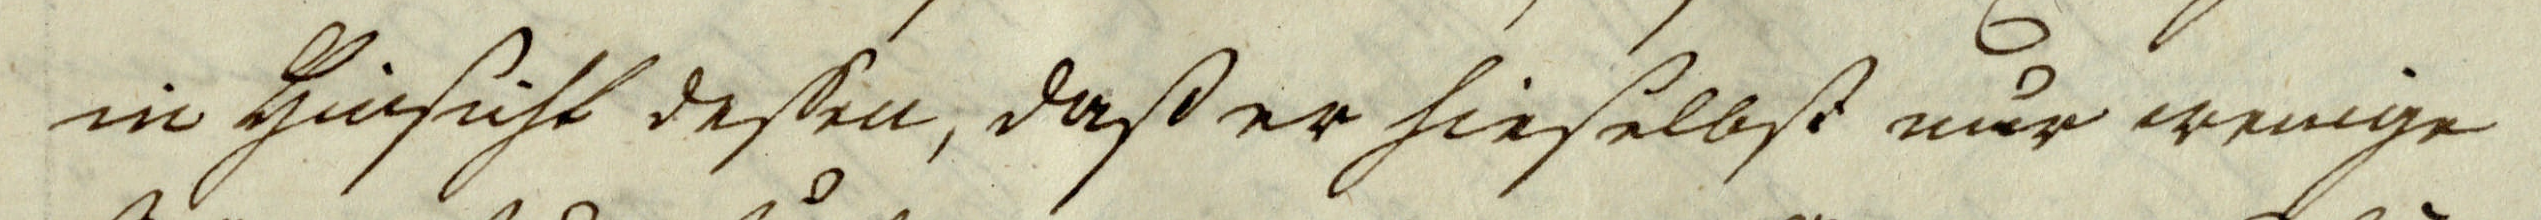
in Hinsicht dessen, daß er hieselbst nur wenige
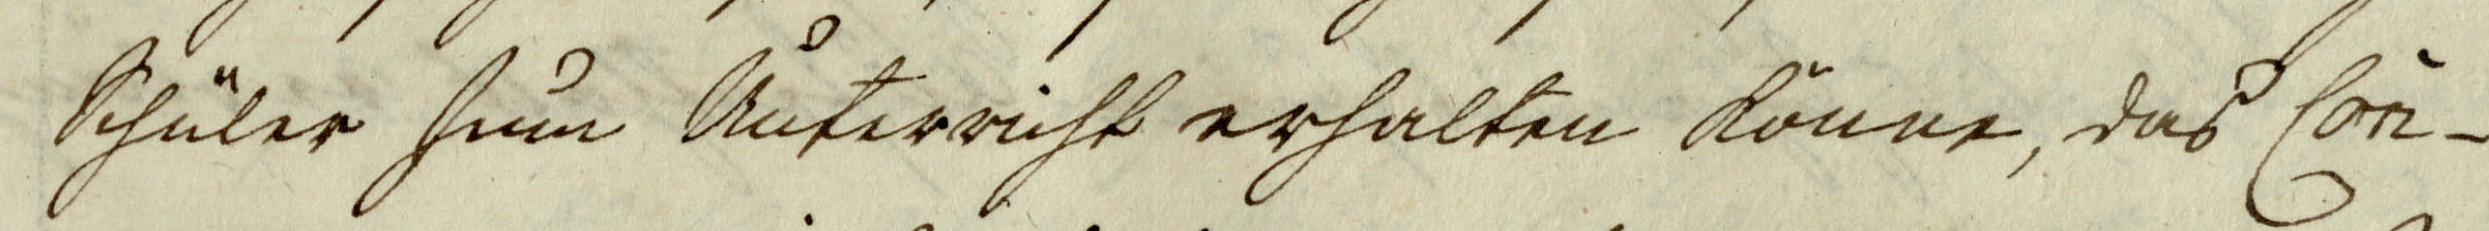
Schüler zum Unterricht erhalten könne, das Con¬
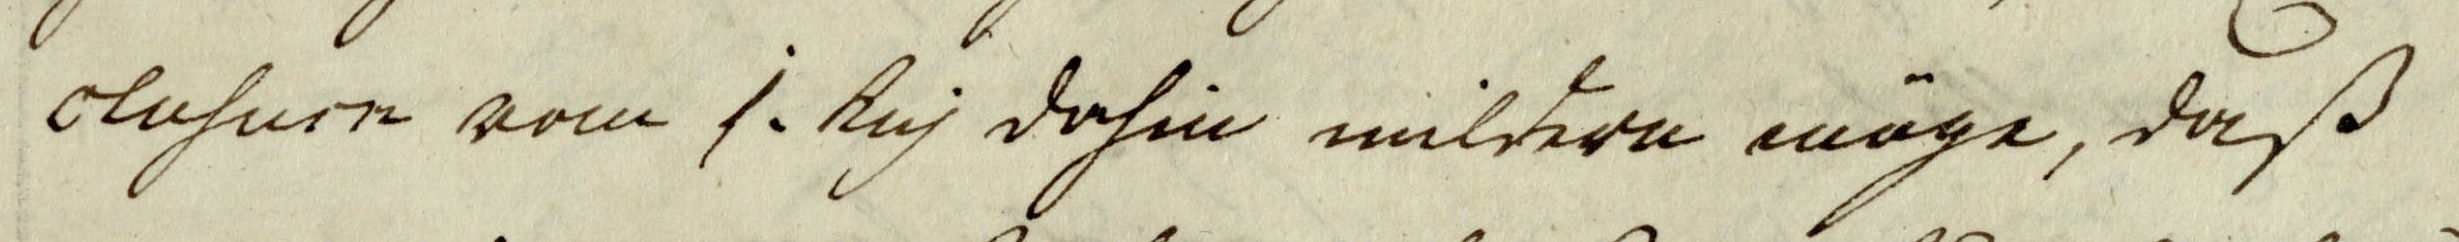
clusum vom 1. huj. dahin mildern möge, daß
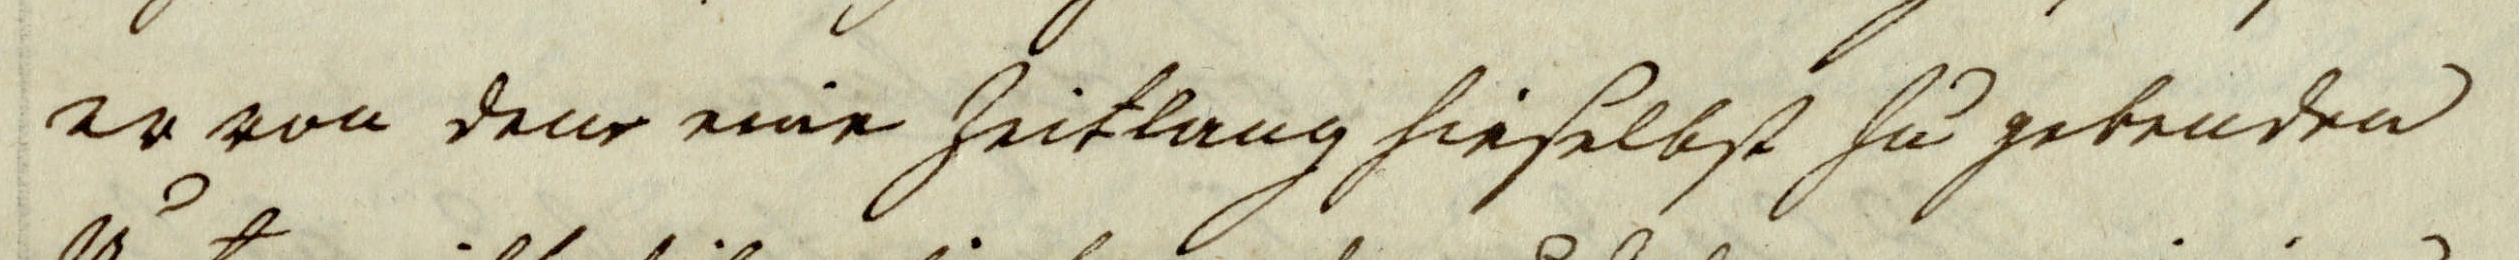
er von dem eine Zeitlang hieselbst zu gebenden
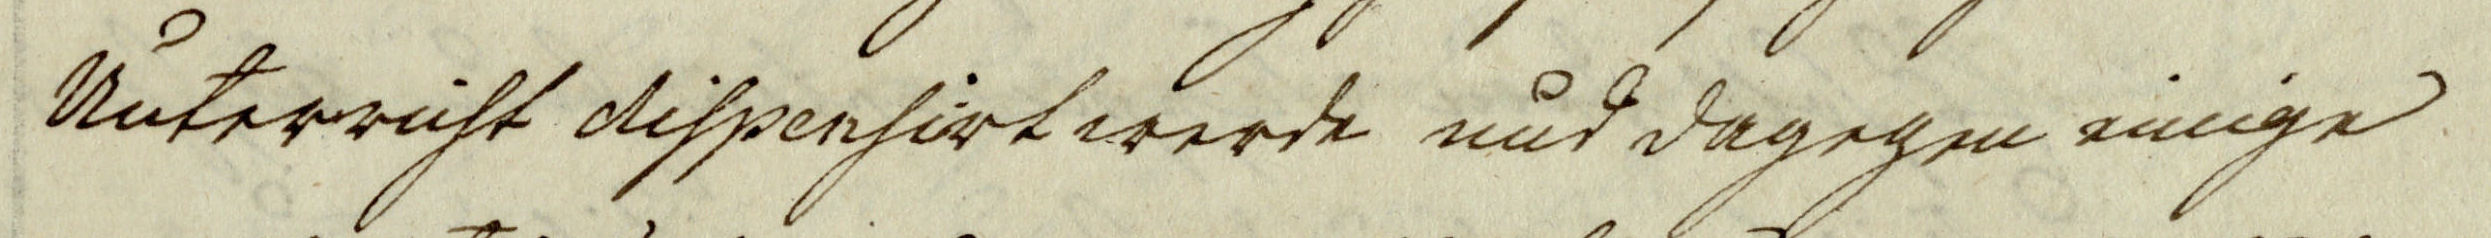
Unterricht dispensirt werde und dagegen einige
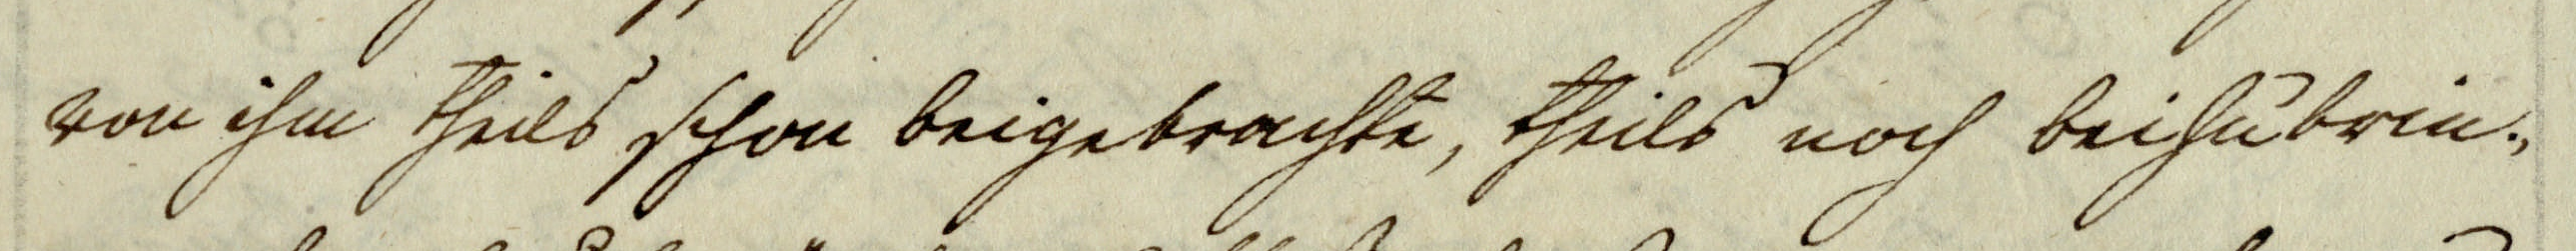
vom ihm theils schon beigebrachte, theils noch beizubrin¬
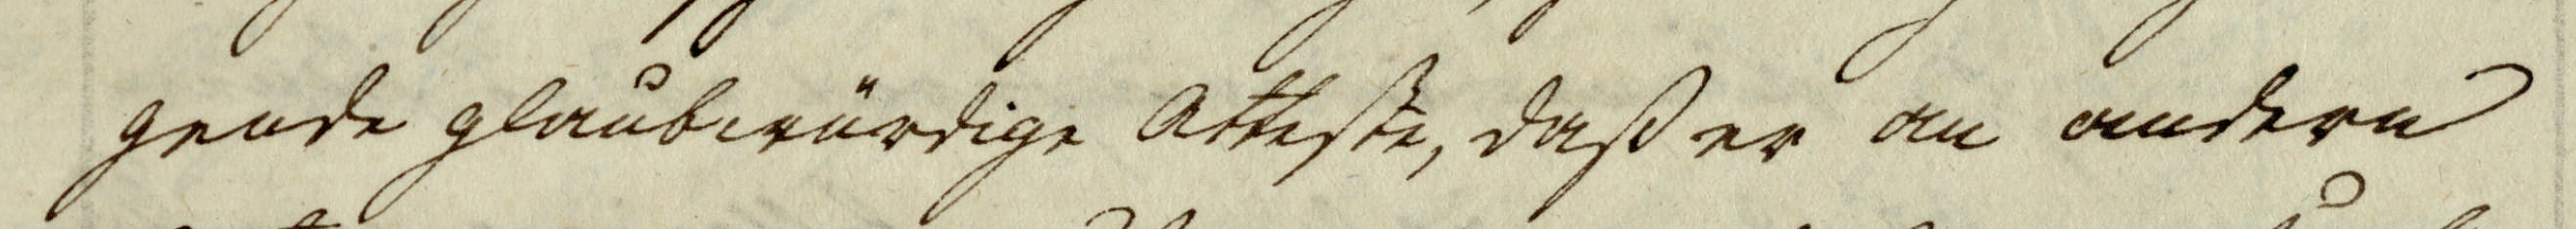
gende glaubwürdige Atteste, daß er an andern
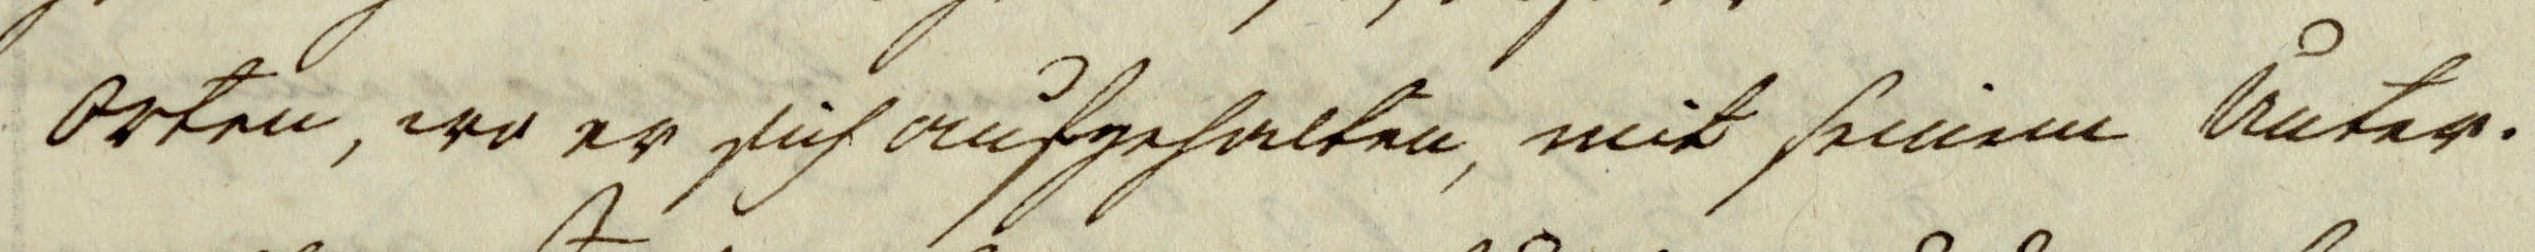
Orten, wo er sich aufgehalten, mit seinem Unter¬
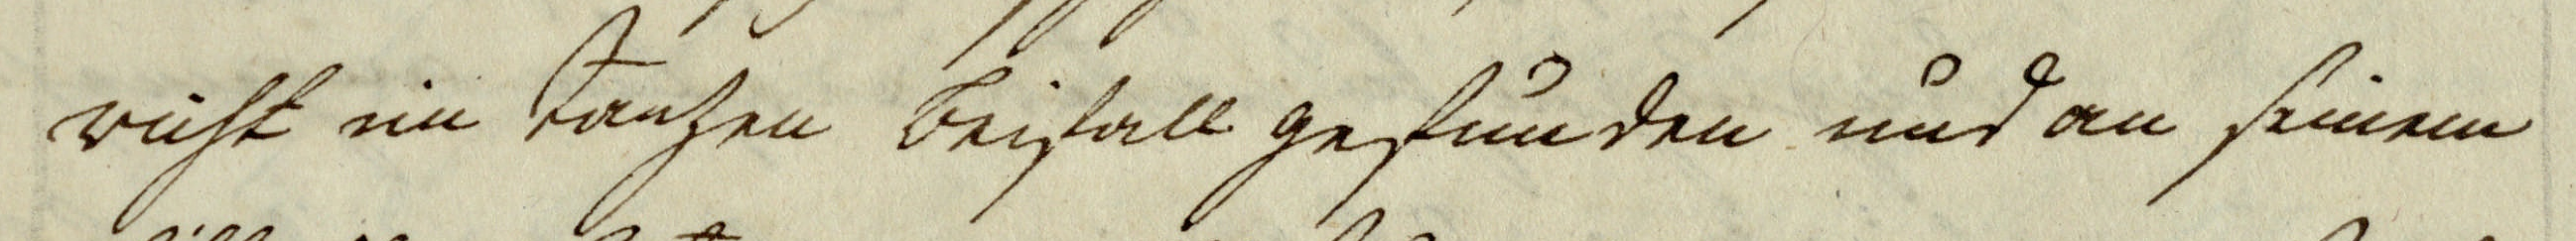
richt im Tanzen Beifall gefunden und an seinem
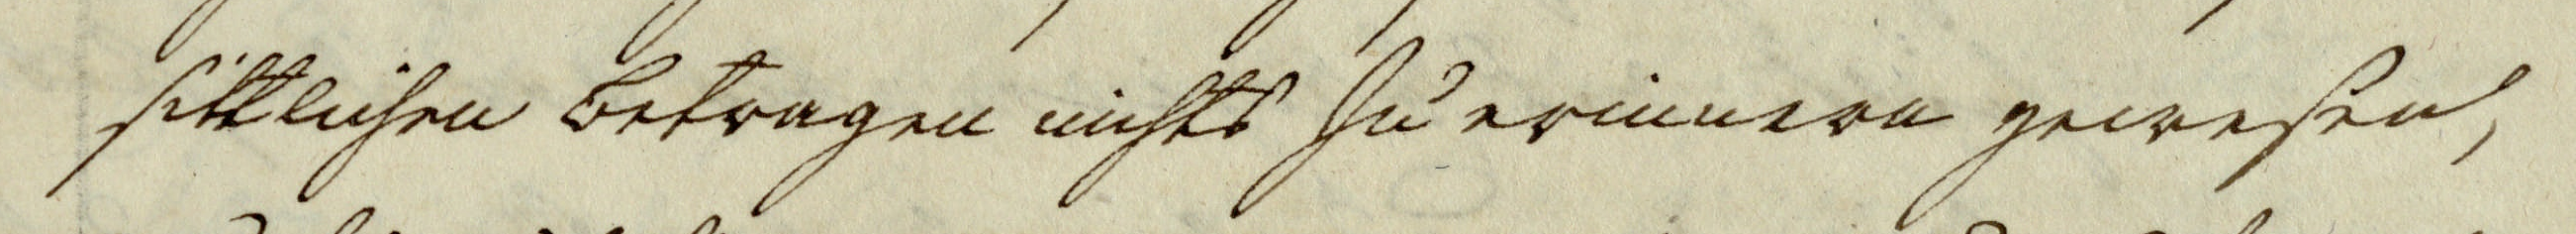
sittlichen Betragen nichts zu erinnern gewesen,
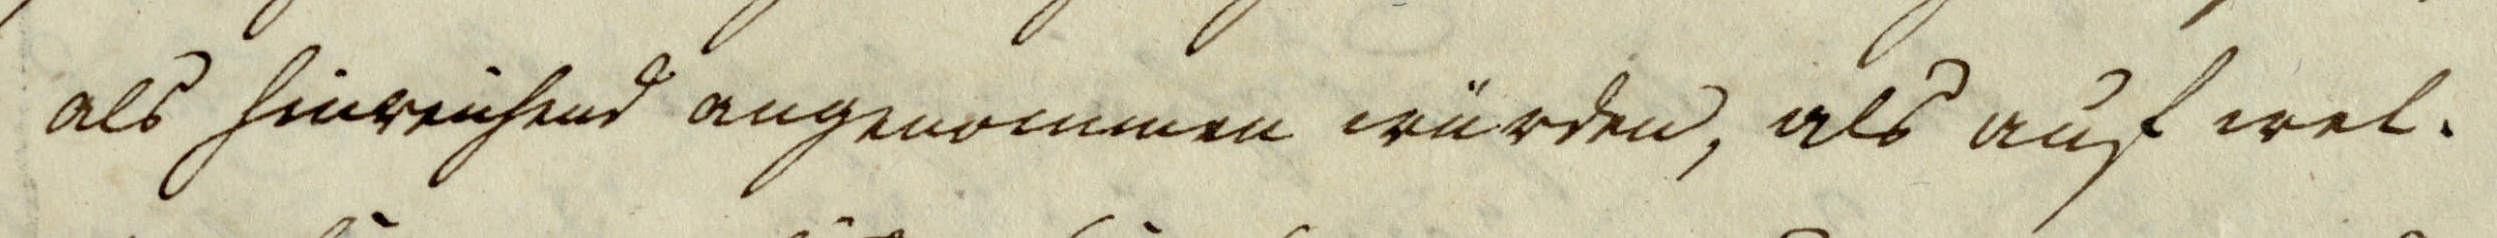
als hinreichend angenommen würden, als auf wel¬
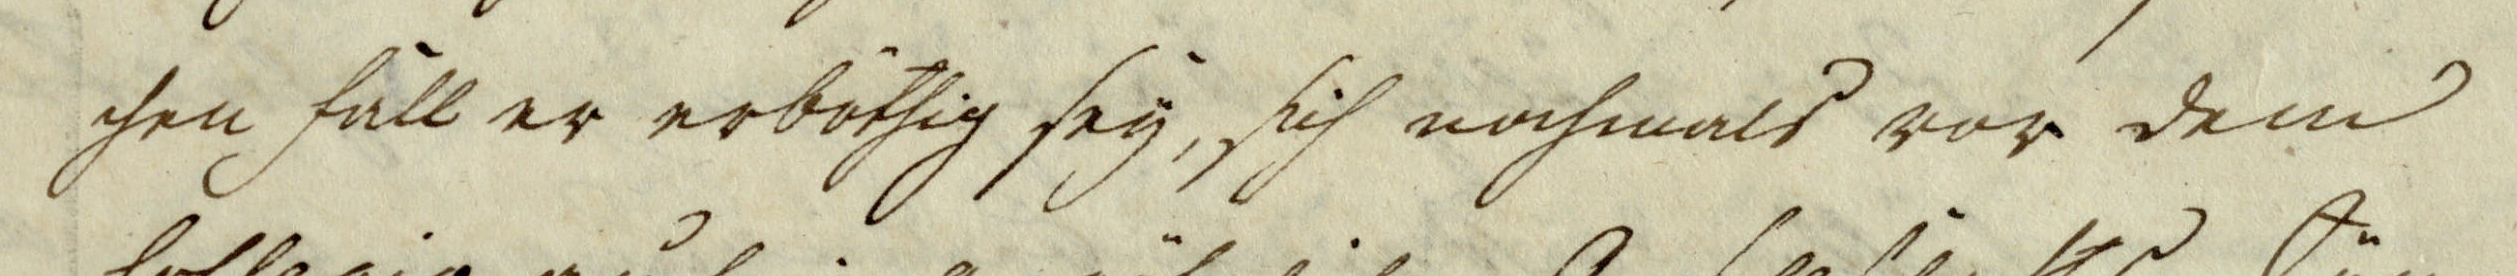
chen Fall er erböthig seÿ, sich nochmals vor dem
